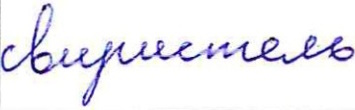свиристель
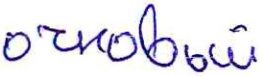очковый
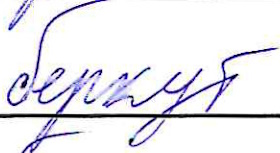беркут
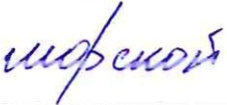морской
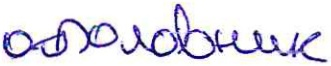ополовник
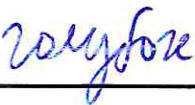голубок
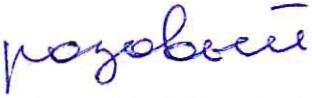розовый
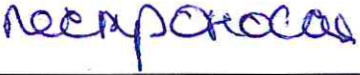пестроносая
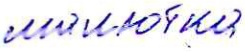малютка
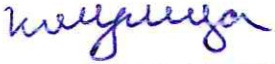клушица
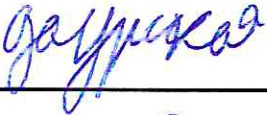даурская
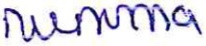питта
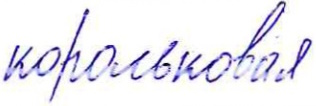корольковая
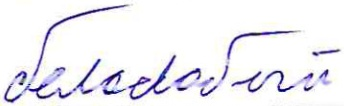белолобый
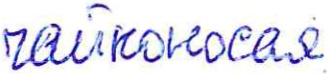чайконосая
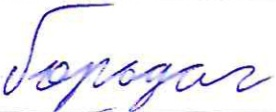бородач
